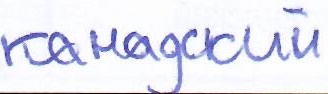канадский
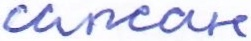сапсан
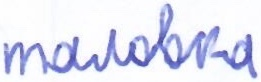таловка
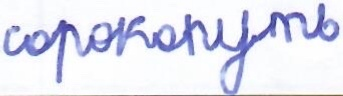сорокопуть
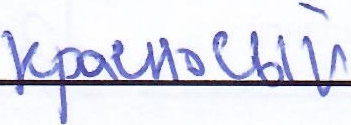красносый
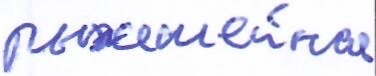рыжешейная
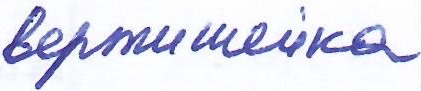вертишейка
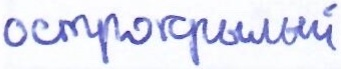острокрылый
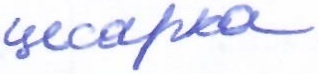цесарка
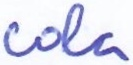сова
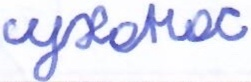сухонос
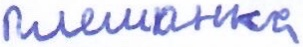плешанка
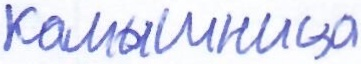камышница
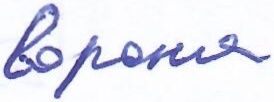ворона
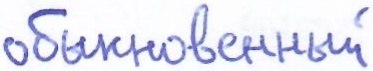обыкновенный
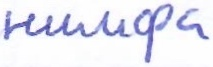нимфа
